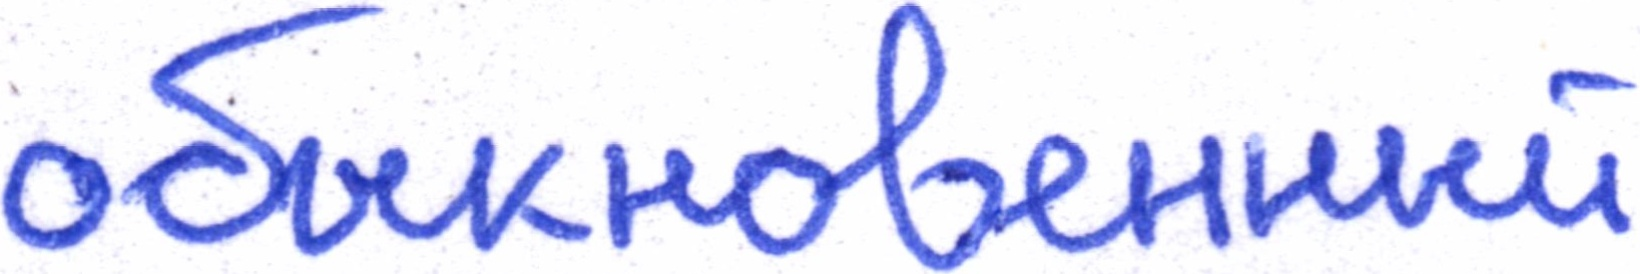обыкновенный
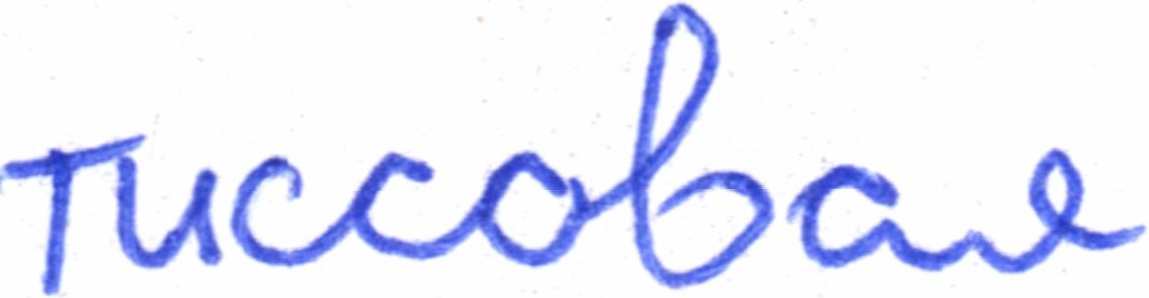тиссовая
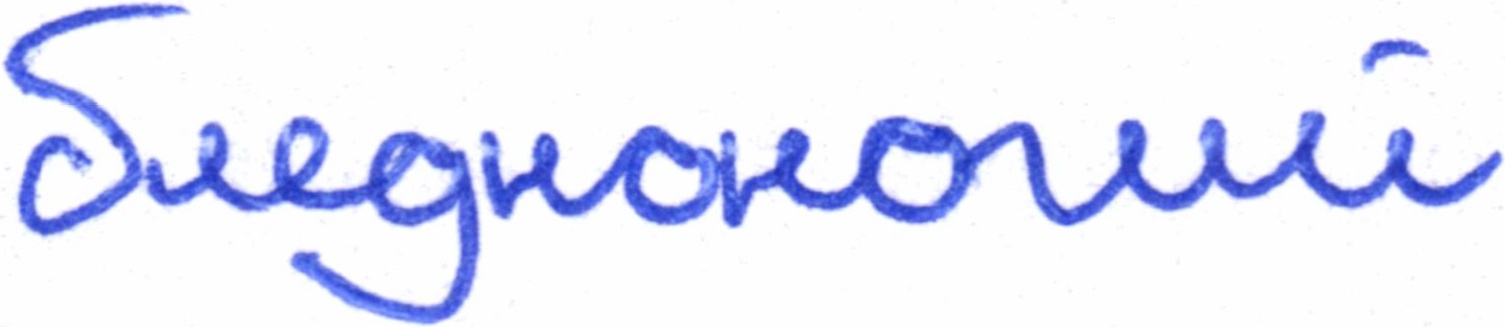бледноногий
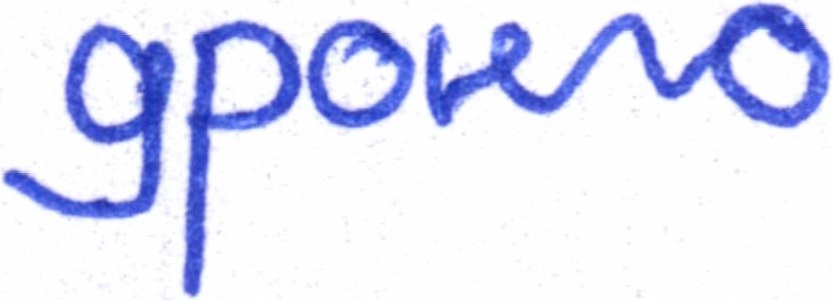дронго
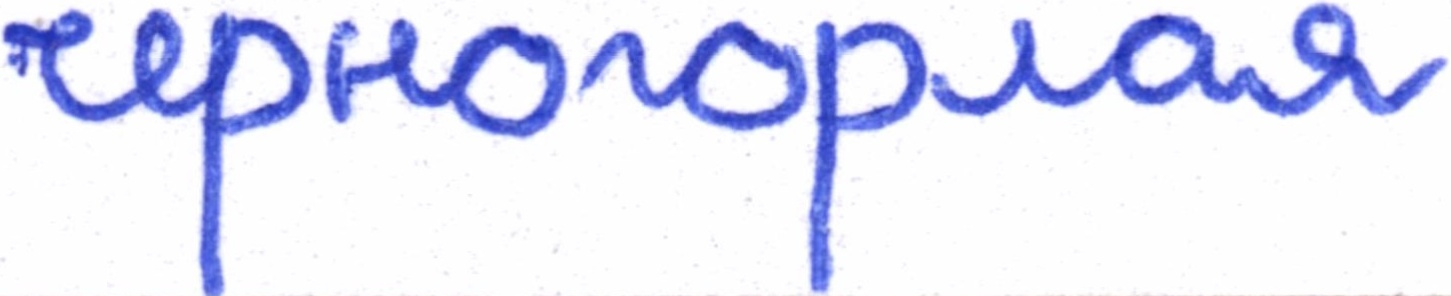черногорлая
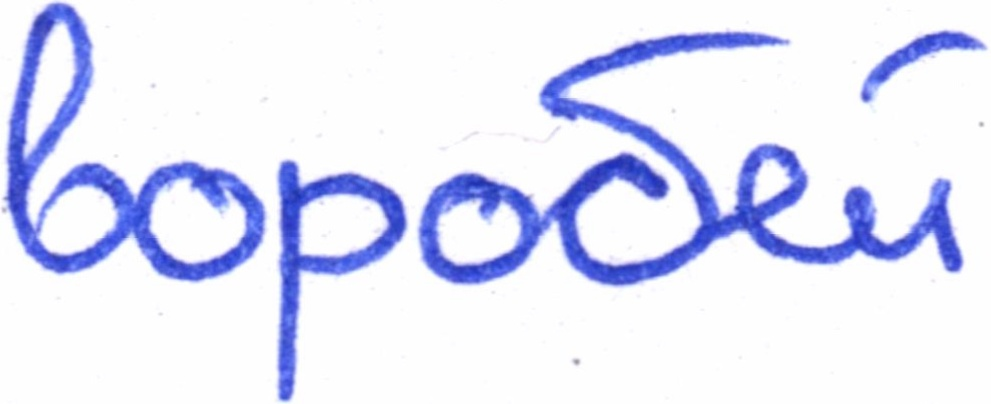воробей
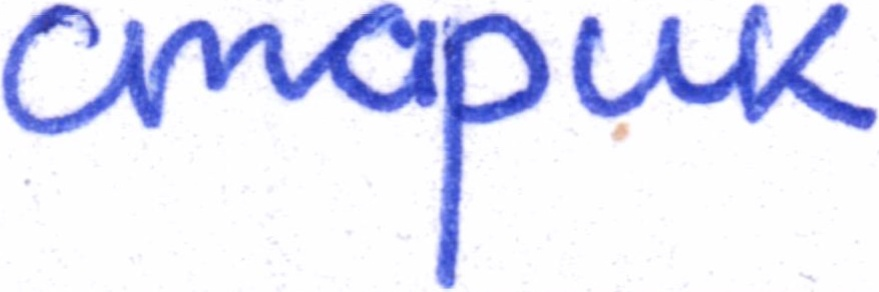старик
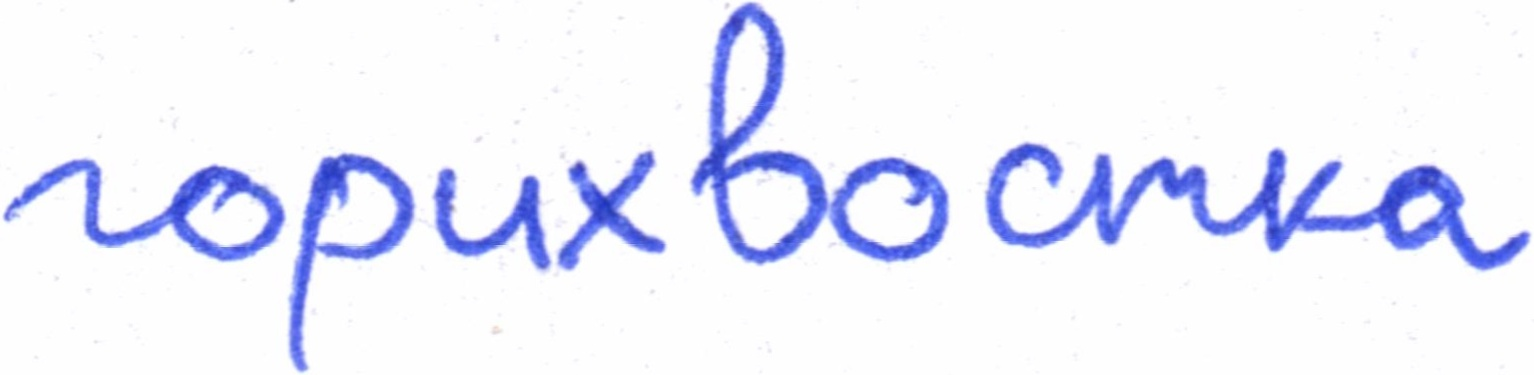горихвостка
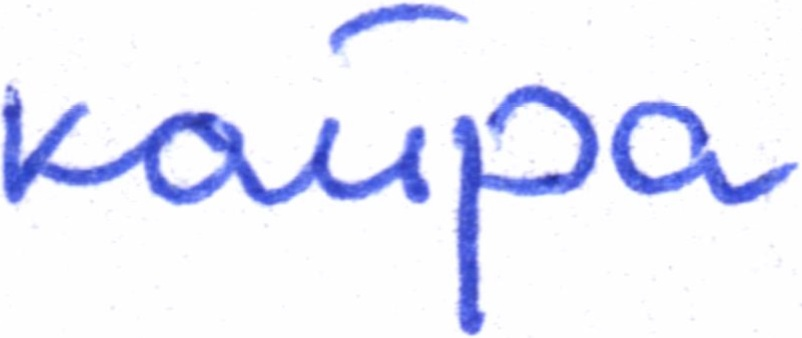кайра
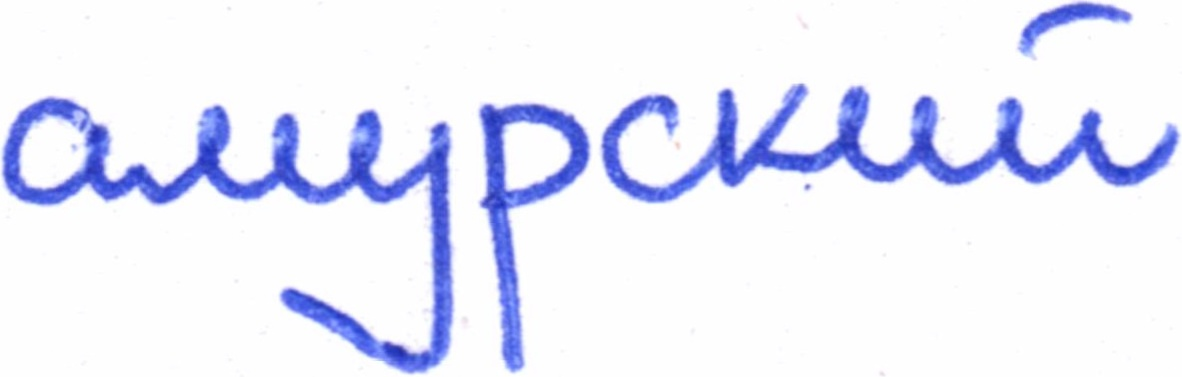амурский
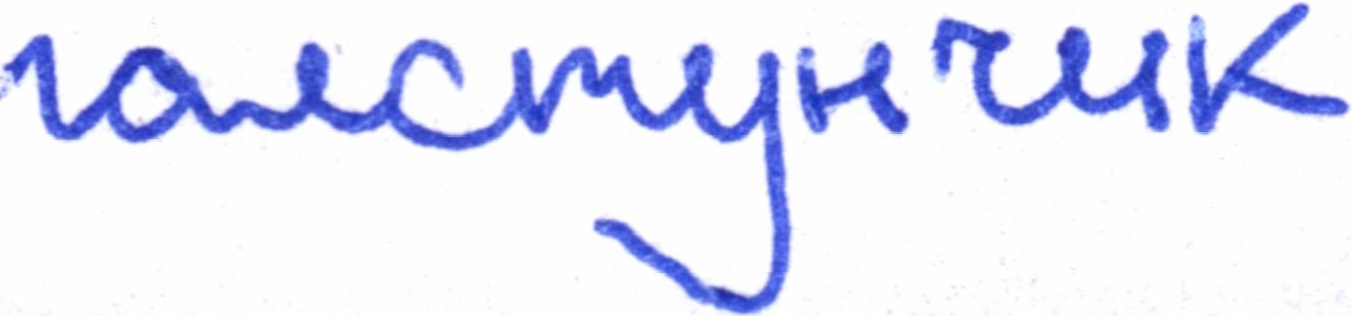галстучник
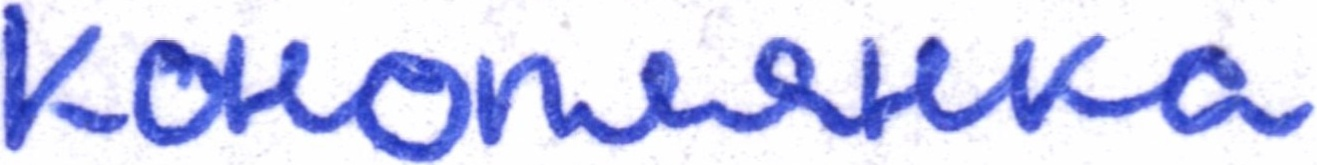коноплянка
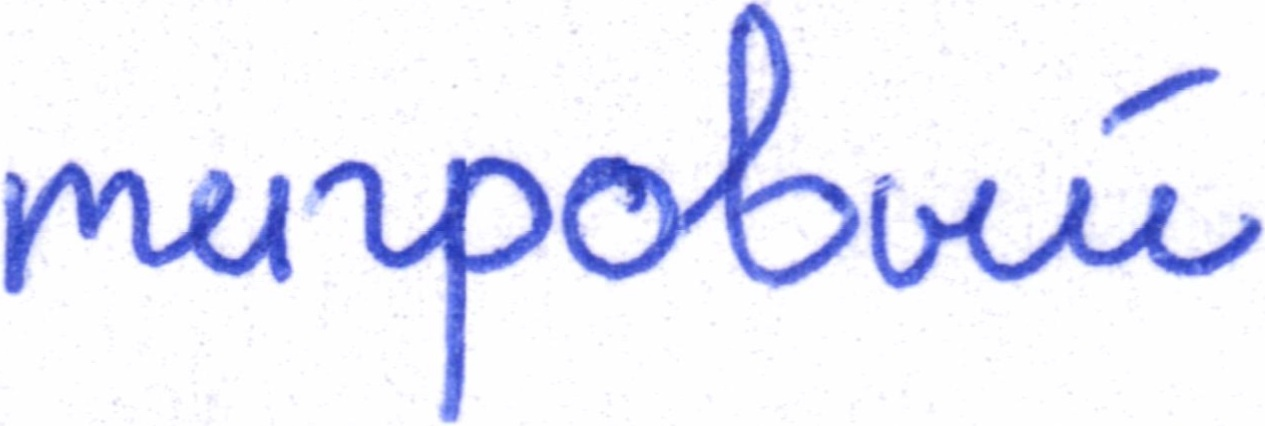тигровый
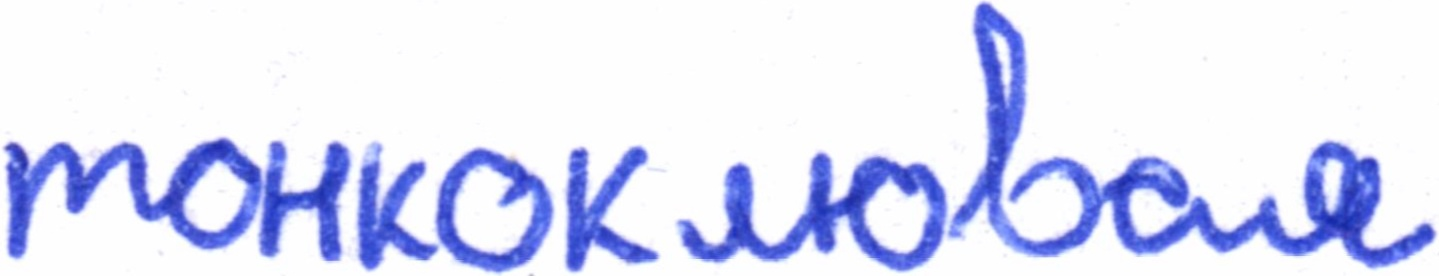тонкоклювая
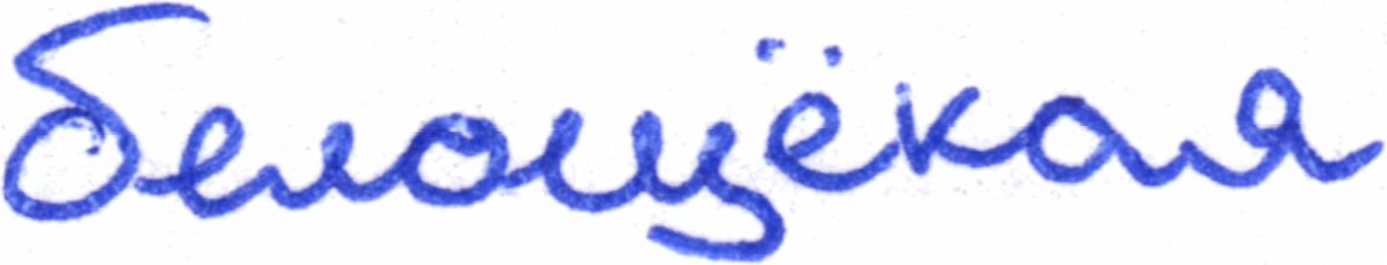белощёкая
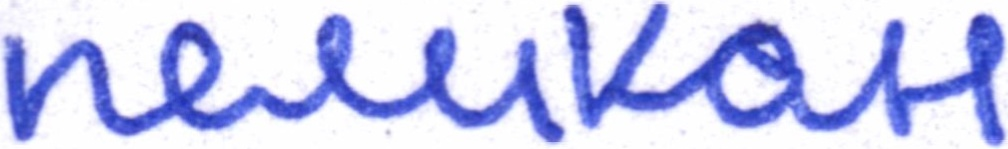пеликан
